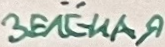зелёная
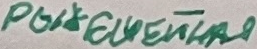рыжешейная
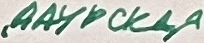даурская
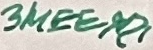змееяд
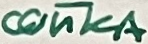сойка
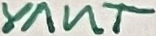улит
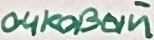очковый
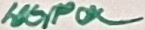нырок
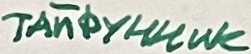тайфунник
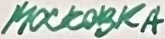московка
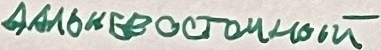дальневосточный
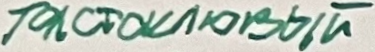толстоклювый
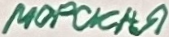морская
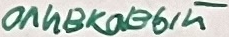оливковый
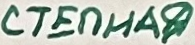степная
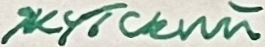якутский
